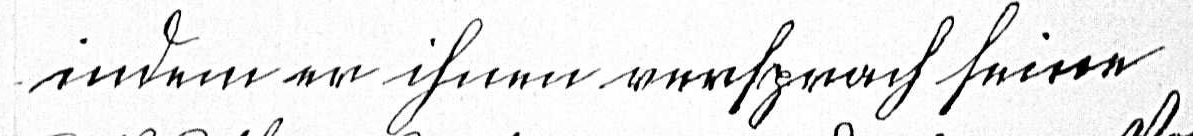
indem er ihnen versprach seine
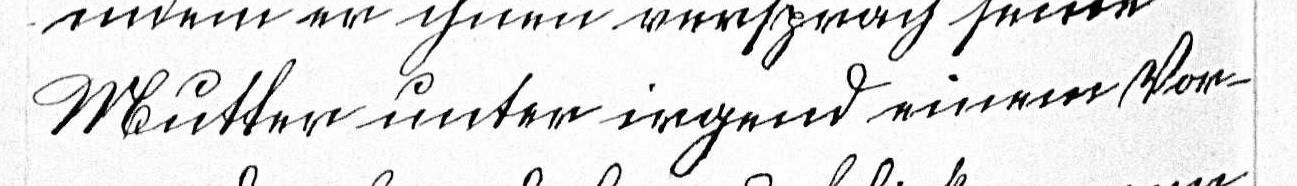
Mutter unter irgend einem Vor¬
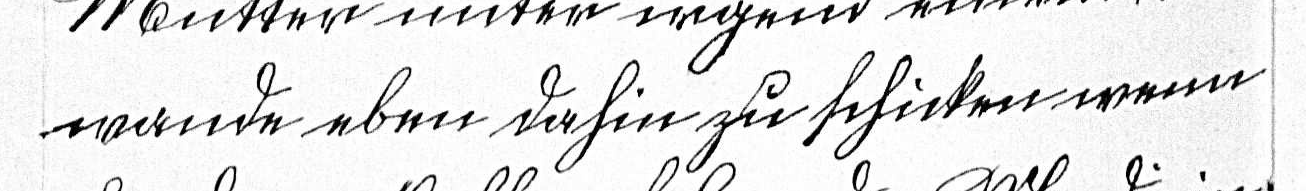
wande eben dahin zu schicken wenn
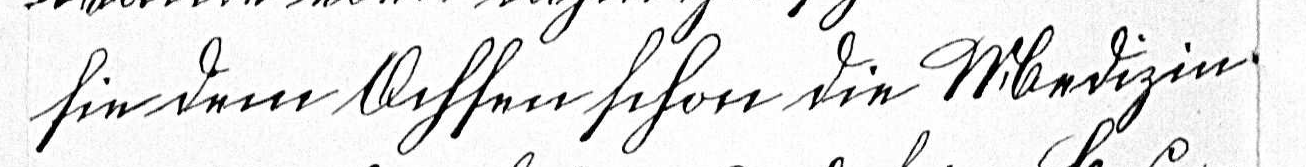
sie dem Ochsen schon die Medizin
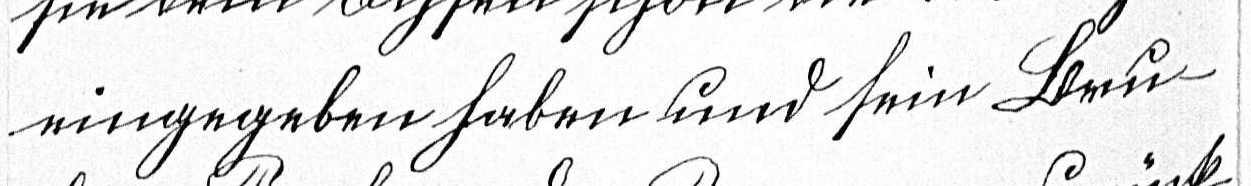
eingegeben haben und sein Bru¬
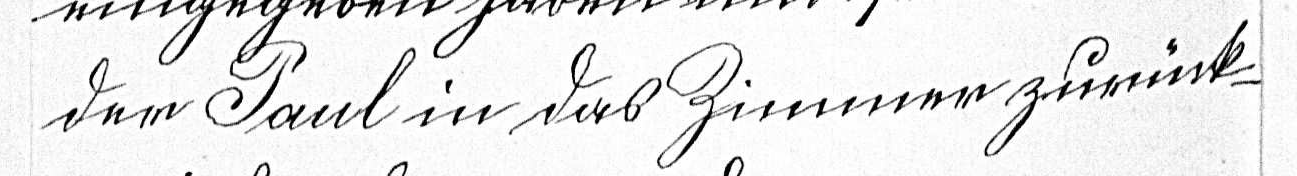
der Paul in das Zimmer zurück¬
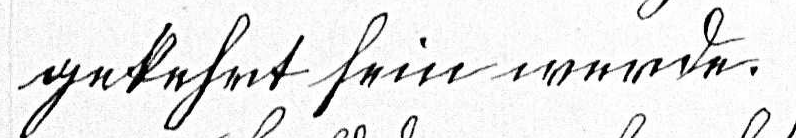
gekehrt sein werde.
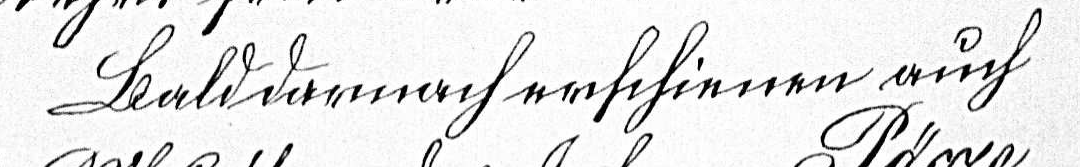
Bald darnach erschienen auch
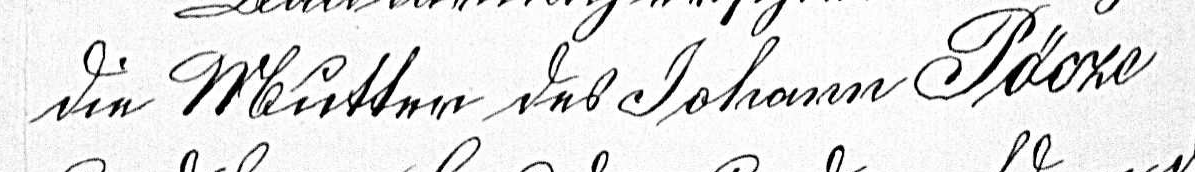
die Mutter des Johann Pöcze
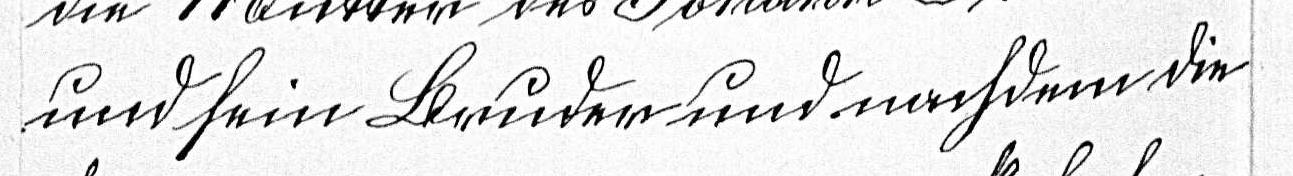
und sein Bruder und nachdem die
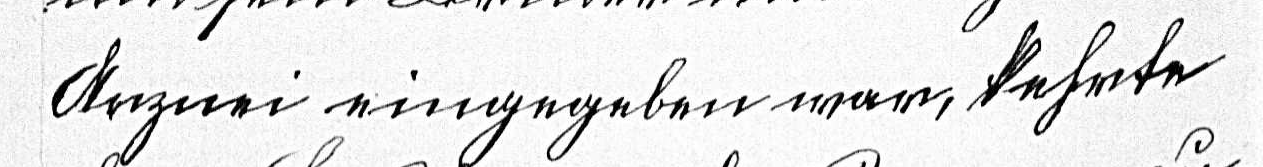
Arznei eingegeben war, kehrte
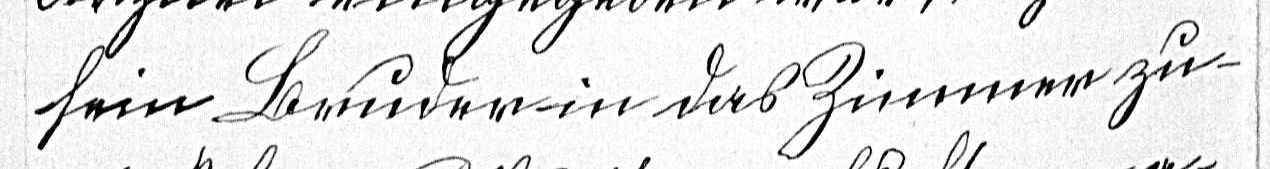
sein Bruder in das Zimmer zu¬
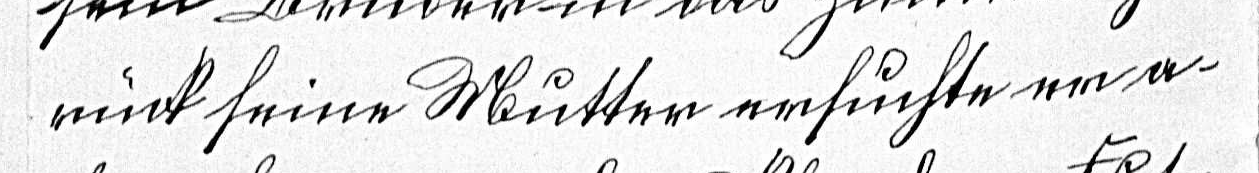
rück seine Mutter ersuchte er a¬
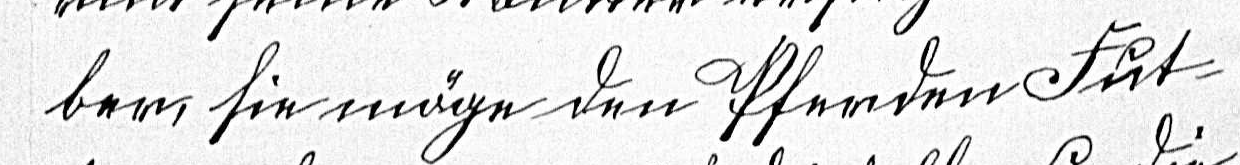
ber, sie möge den Pferden Fut¬
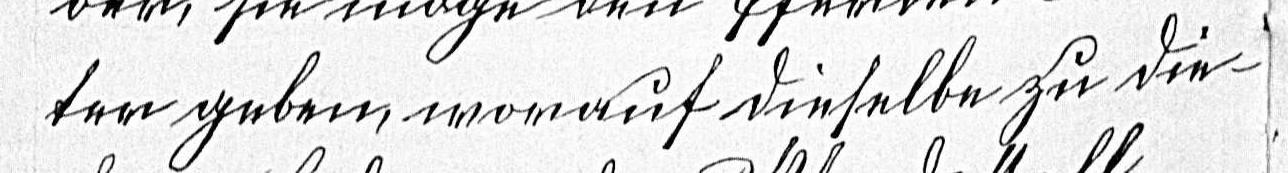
ter geben, worauf dieselbe zu die¬
